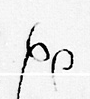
1.)
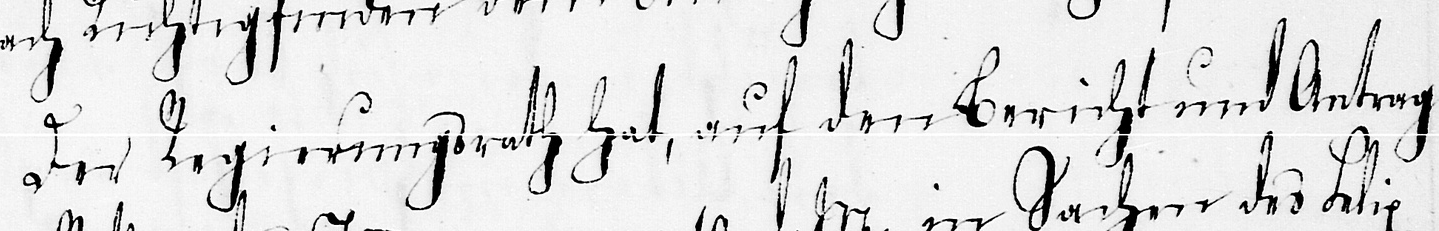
Der Regierungsrath hat, auf den Bericht und Antrag
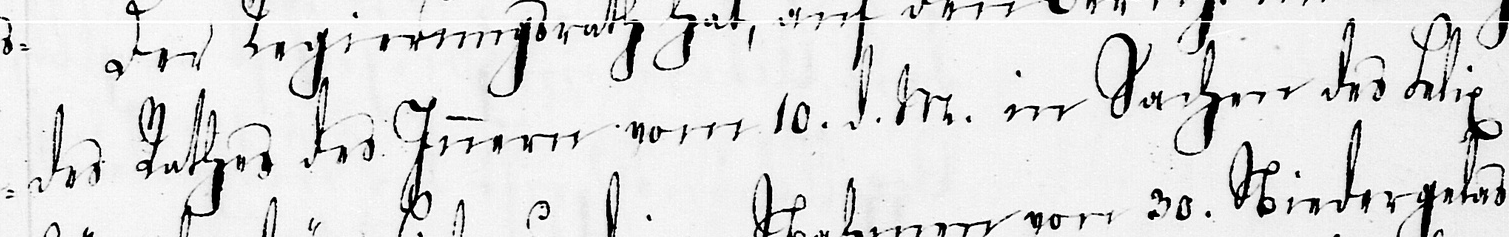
des Rathes des Innern vom 10. d. M. in Sachen des Felix
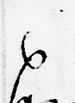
30.
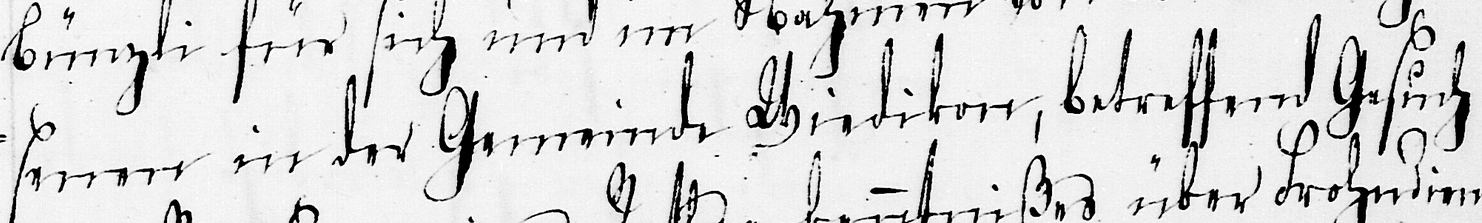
ßenen in der Gemeinde Wiedikon, betreffend Gesuch
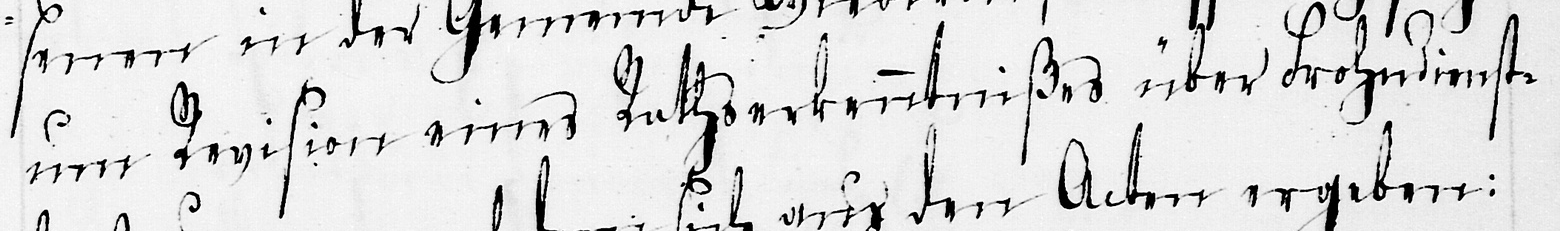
um Revision eines Rathserkenntnißes über Frohndienst¬
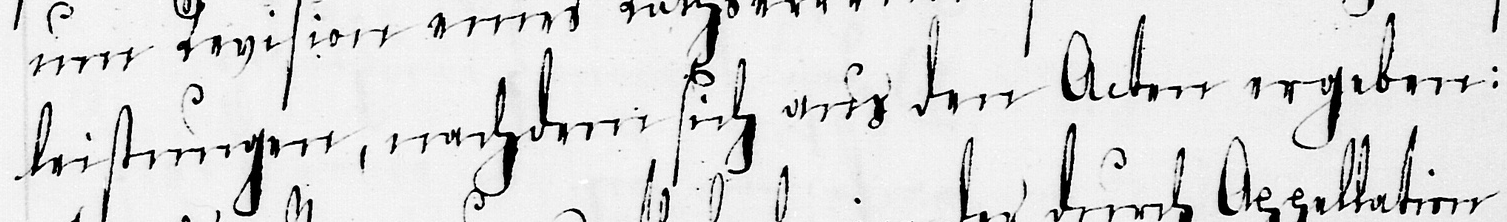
leistungen, nachdem sich aus den Acten ergeben:
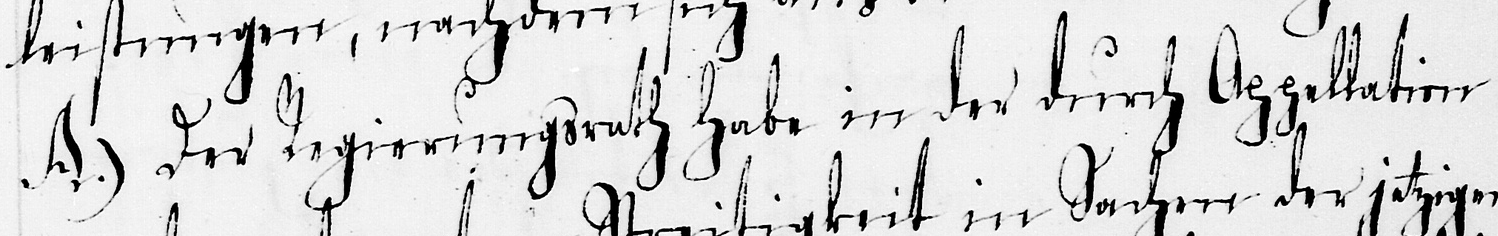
A.) Der Regierungsrath habe in der durch Appellation
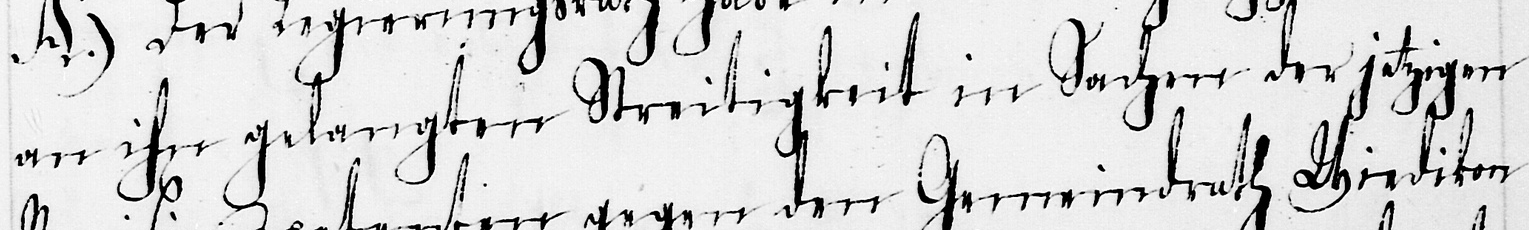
an ihn gelangten Streitigkeit in Sachen der jetzigen
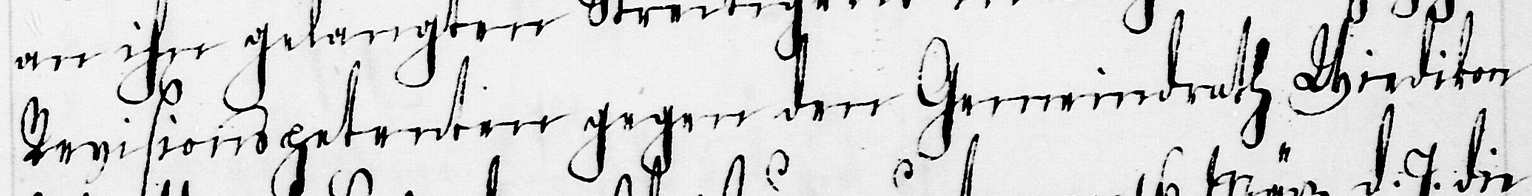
Revisionspetenten gegen den Gemeindrath Wiedikon
